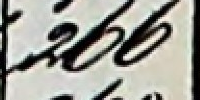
266
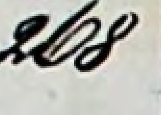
268
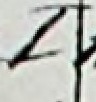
I
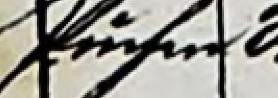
Puchen
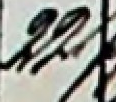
22
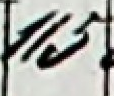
115
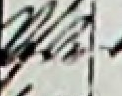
Pfs„
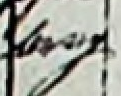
berg
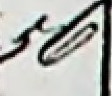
56
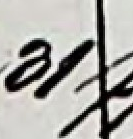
31
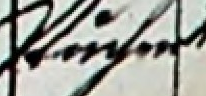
Puchen
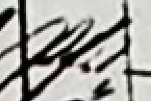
Pfs„
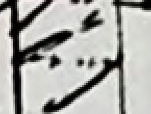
berg
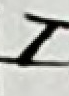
I
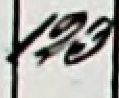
123
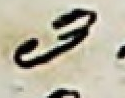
3
